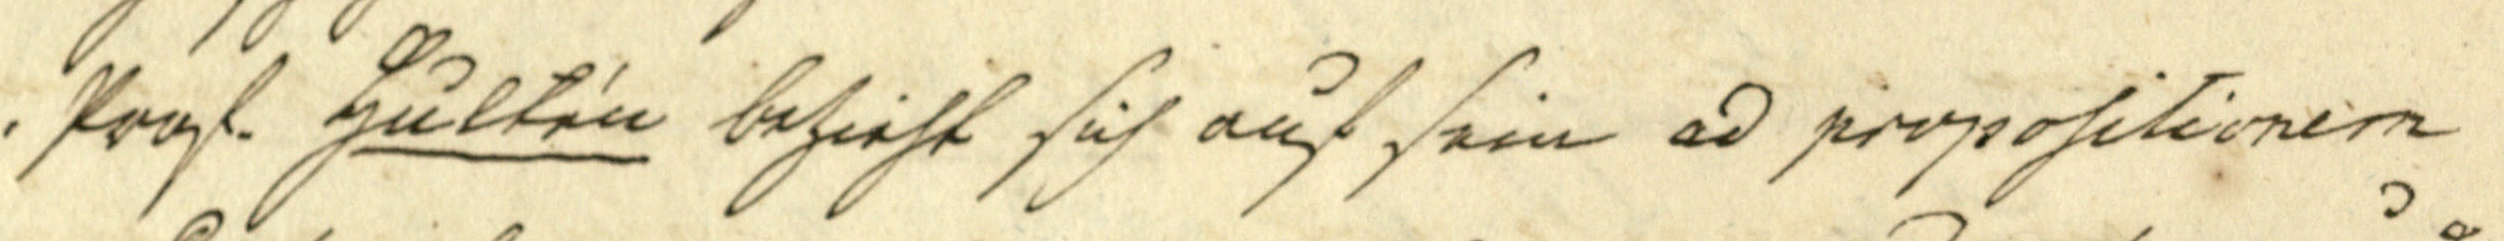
Prof. Hultén bezieht sich auf sein ad propositionem
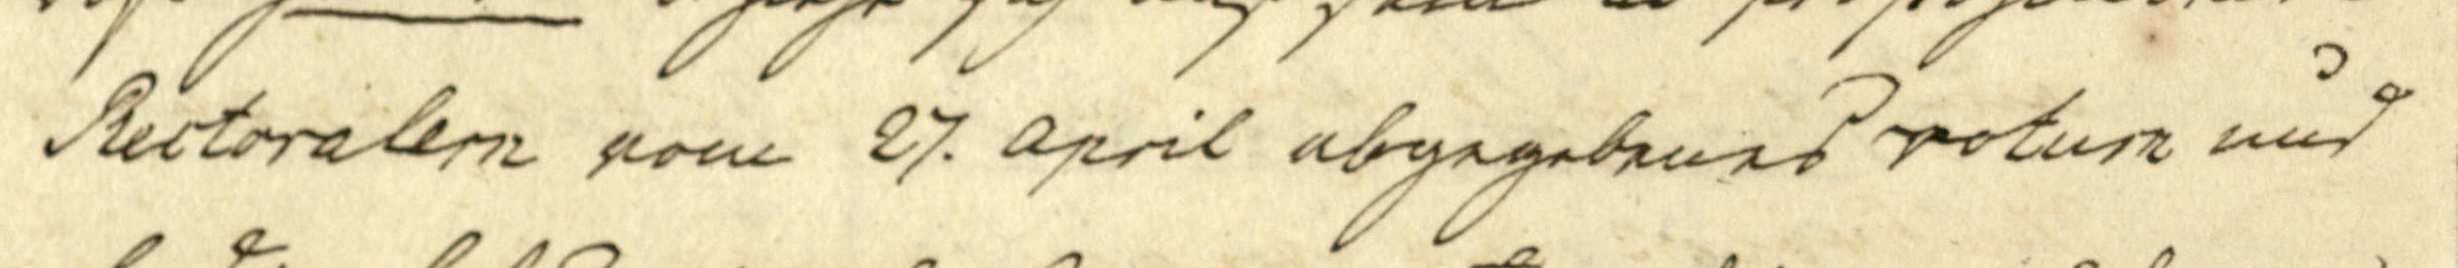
Rectoralem vom 27. April abgegebenes votum und
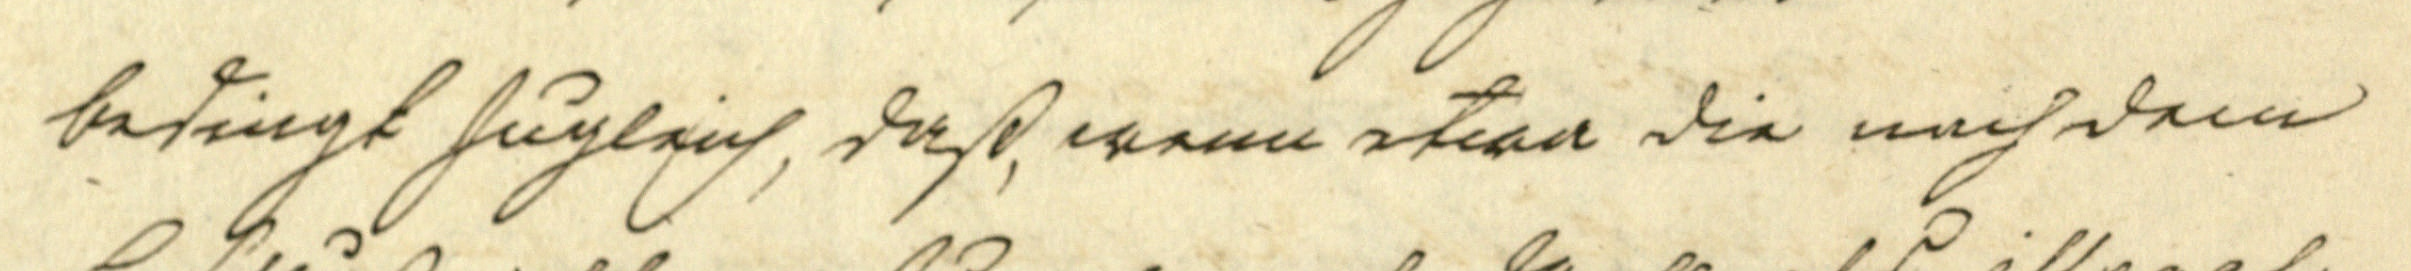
bedinget zugleich, daß, wenn etwa die nach dem
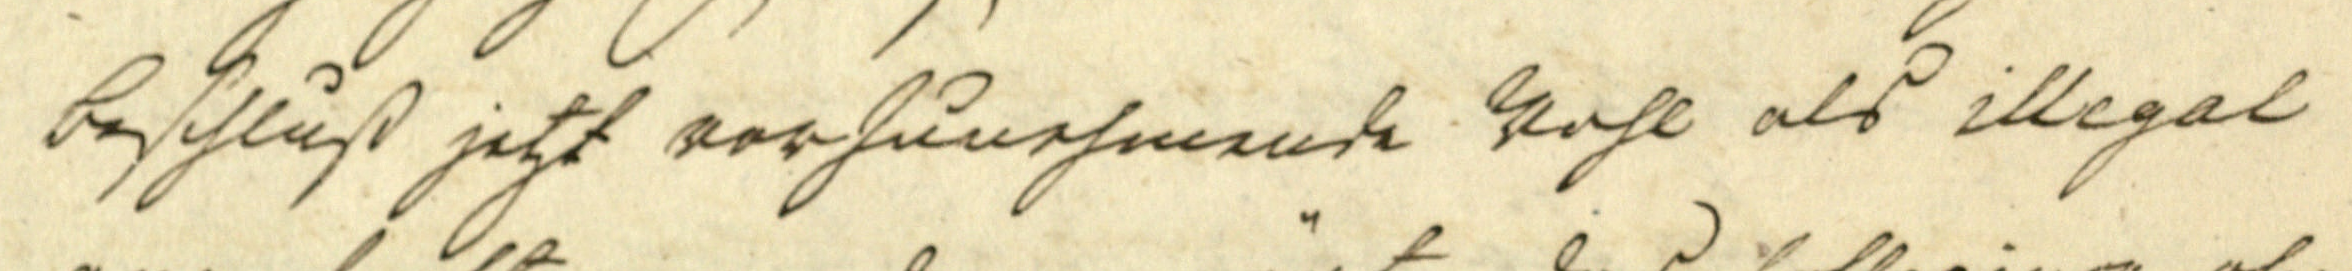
Beschluß jetzt vorzunehmende Wahl als illegal
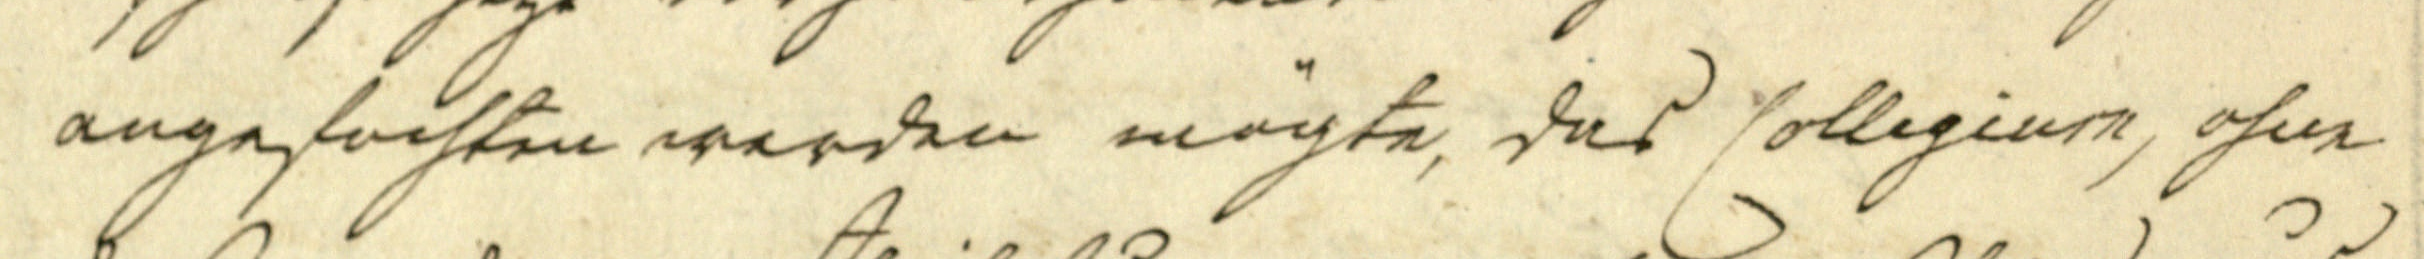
angefochten werden mögte, das Collegium, ohne
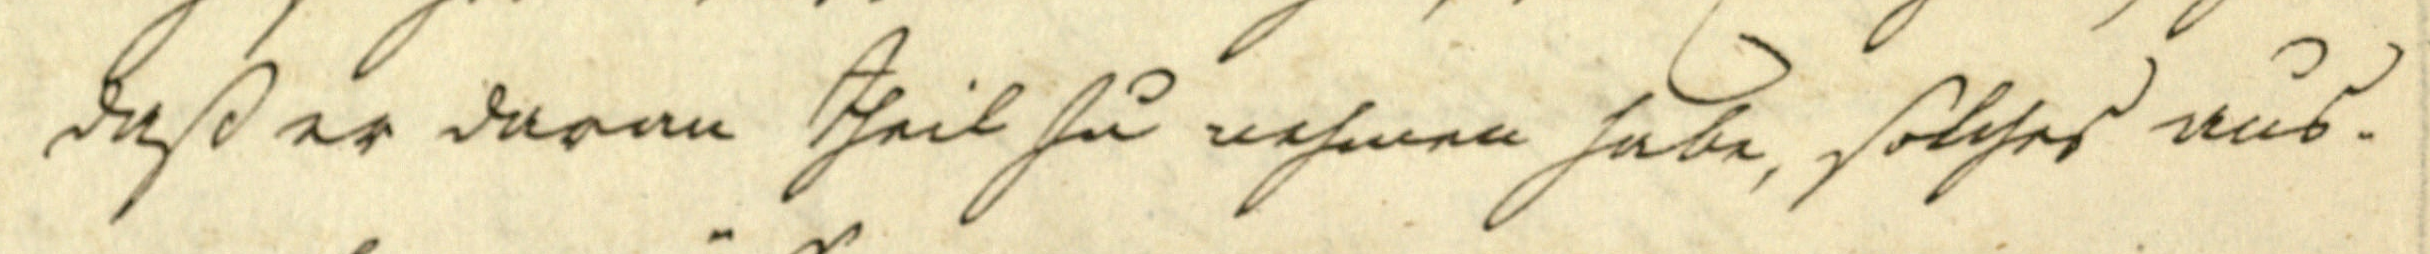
daß er daran Theil zu nehmen habe, solches aus¬
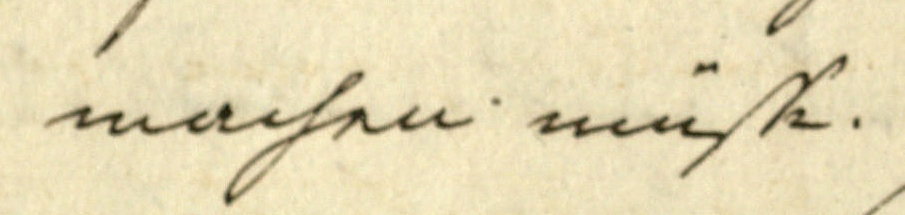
machen müsse.
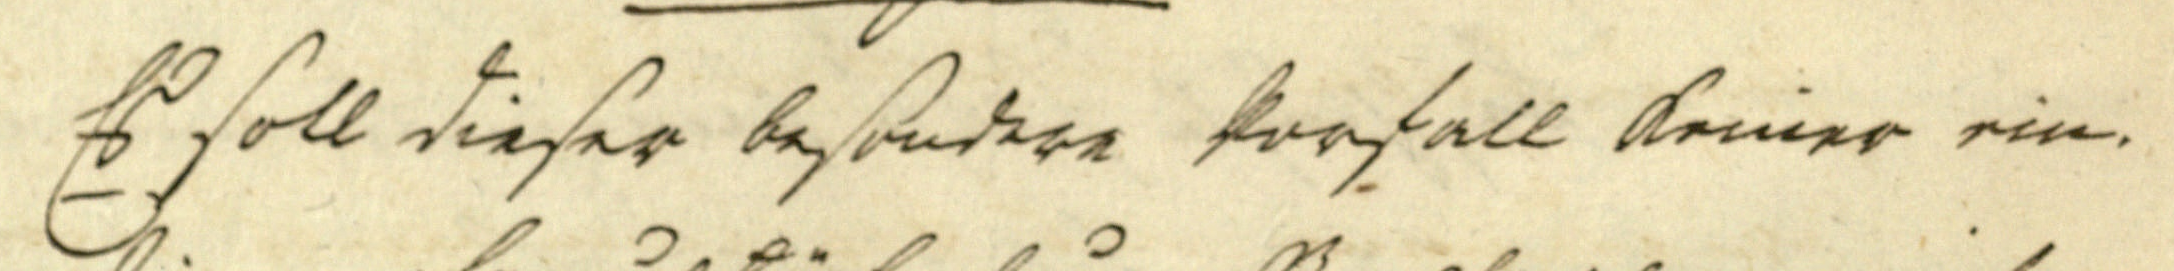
Es soll dieser besondere Vorfall keiner ein¬
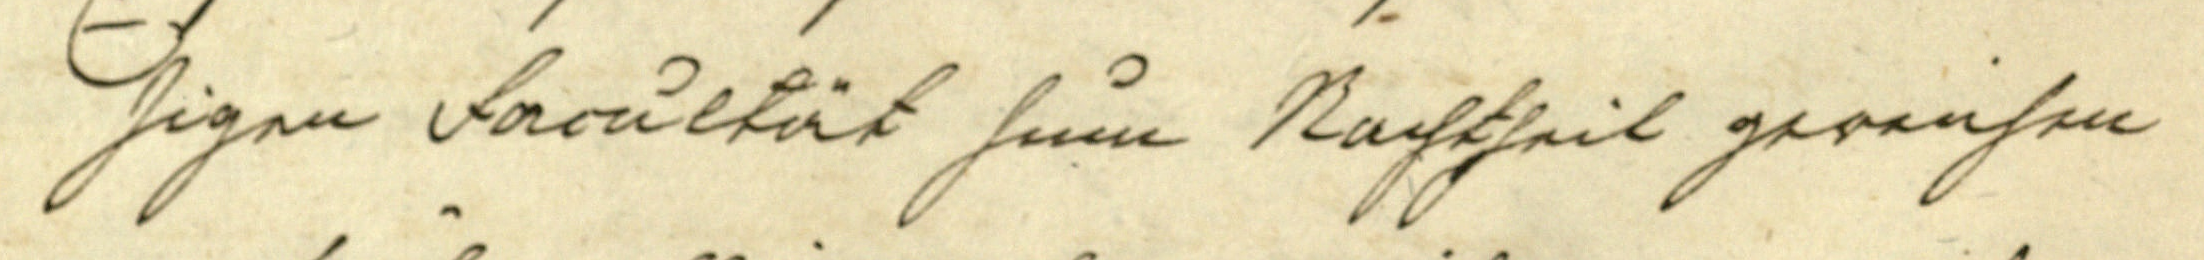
zigen Facultät zum Nachtheil gereichen
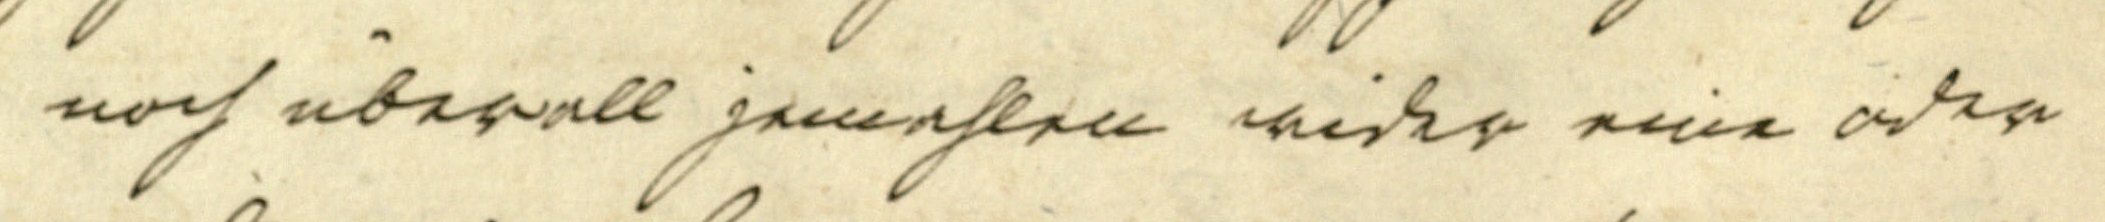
noch überall jemahlen weder eine oder
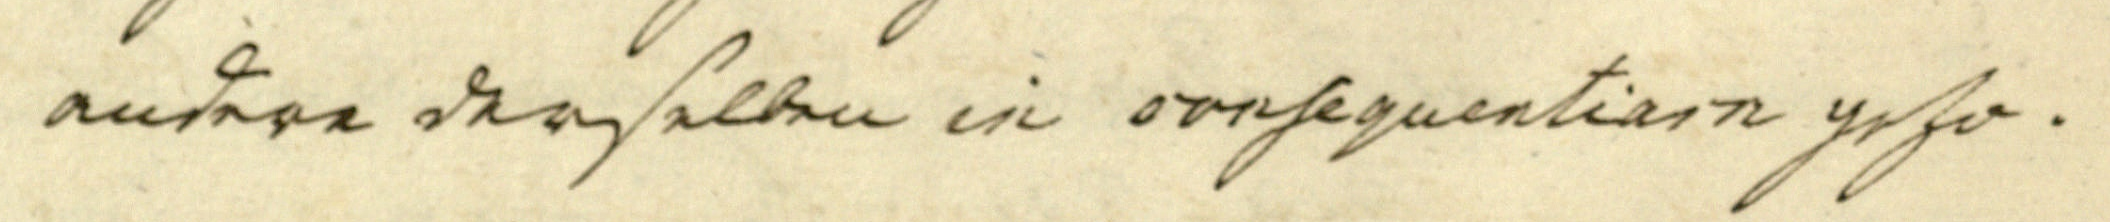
andere derselben in consequentiam gezo¬
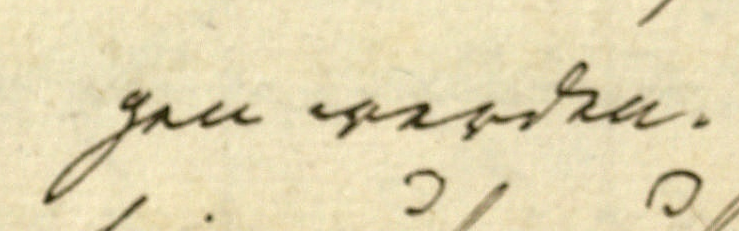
gen werden.
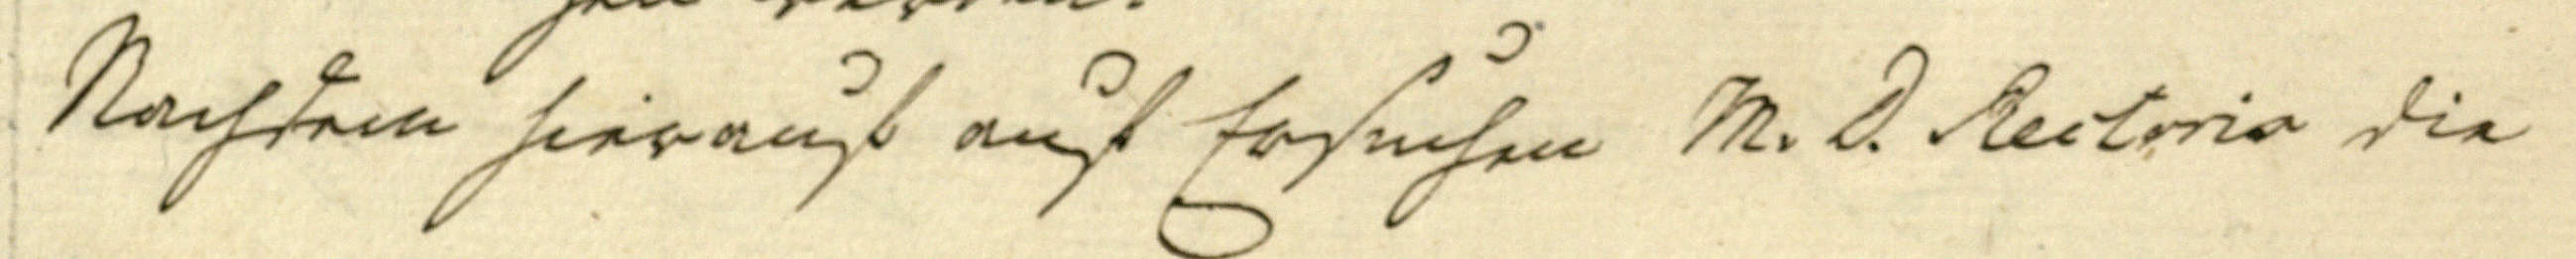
Nachdem hierauf auf Ersuchen M. D. Rectoris die
